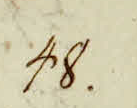48.
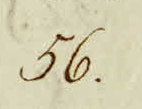56.
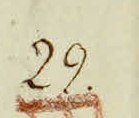29.
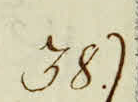38.
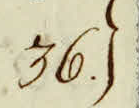36.
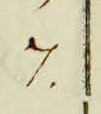7.
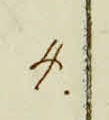4.
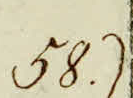58.
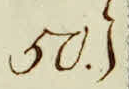50.
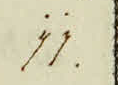11.
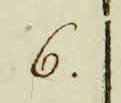6.
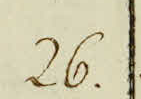26.
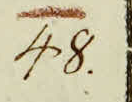48.
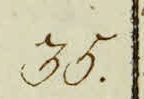35.
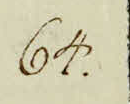64.
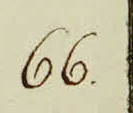66.
